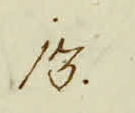13.
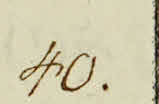40.
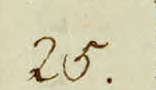25.
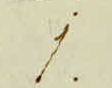1.
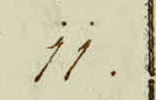11.
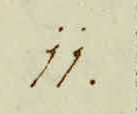11.
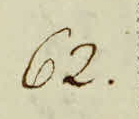62.
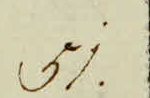51.
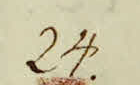24.
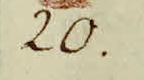20.
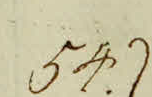54.
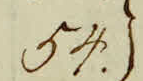54.
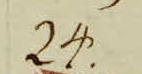24.
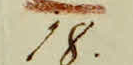18.
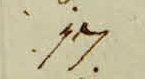17.
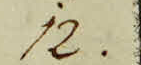12.
